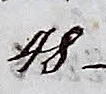48
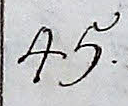45
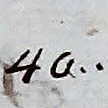40
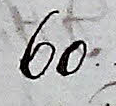60
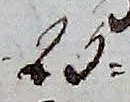25
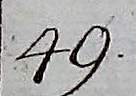49
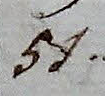51
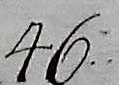46
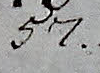57
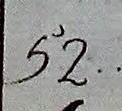52
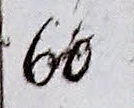60
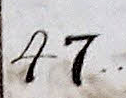47
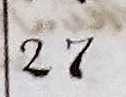27
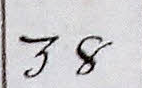38
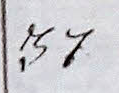37
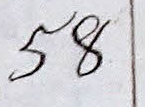58
